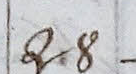28
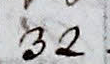32
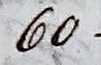60
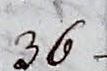36
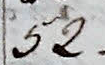52
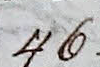46
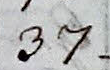37
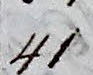41
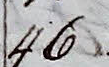46
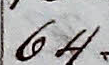64
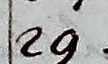29
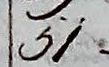51
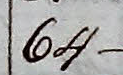64
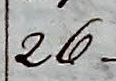26
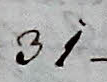31
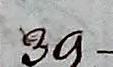39
